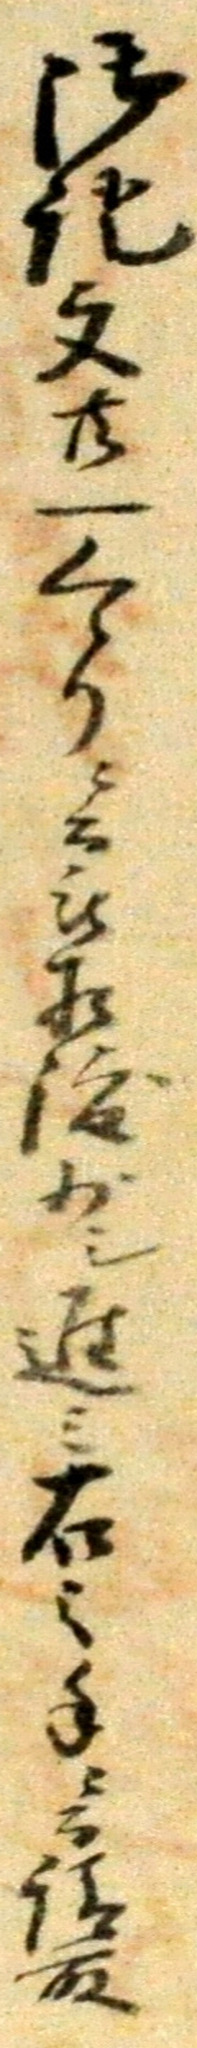御證文共一くゝりニ而被相渡少シ進ミ右之手ニ而請取
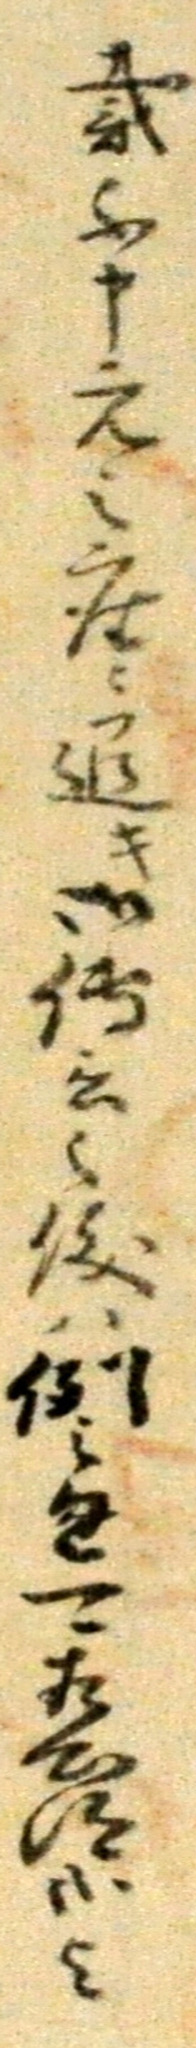戴不申元之座ニ退キ御伝言之儀ハ例之通可相心得哉と
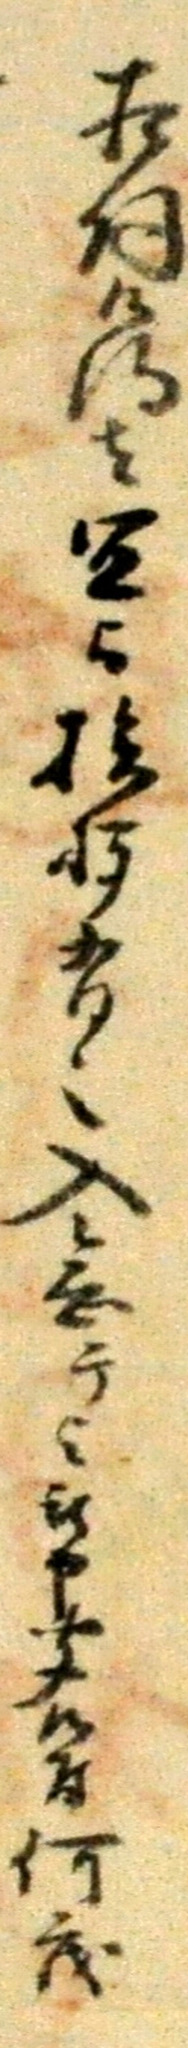相伺候得は宜と挨拶有之入念テと被申聞候付何も
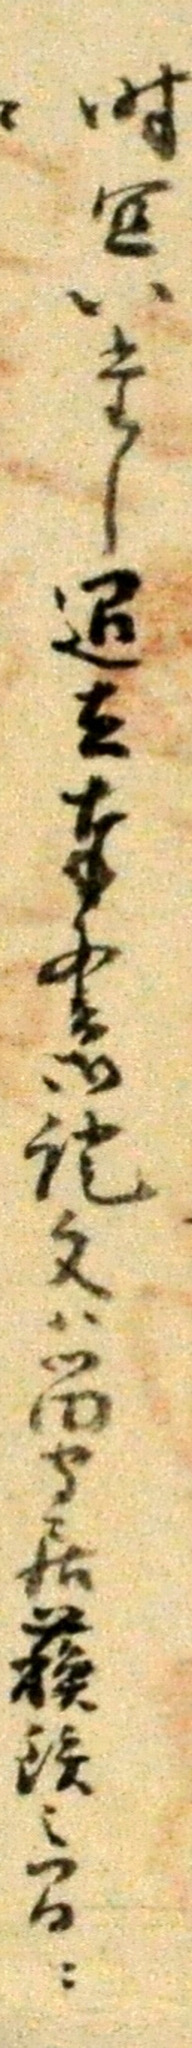時宜いたし退去奉書御證文ハ留守居蘇鉄之間ニ
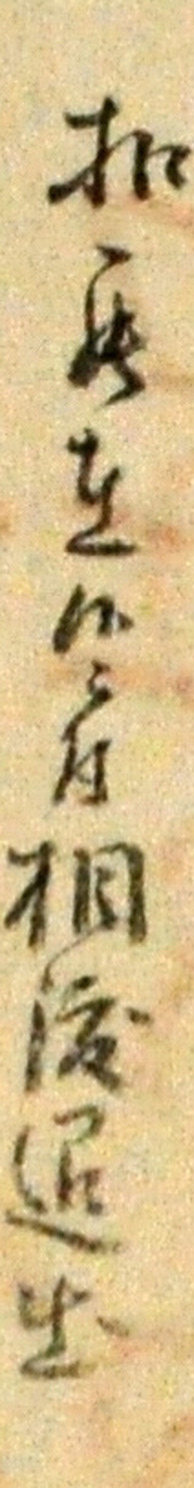扣罷在候二付相渡退出

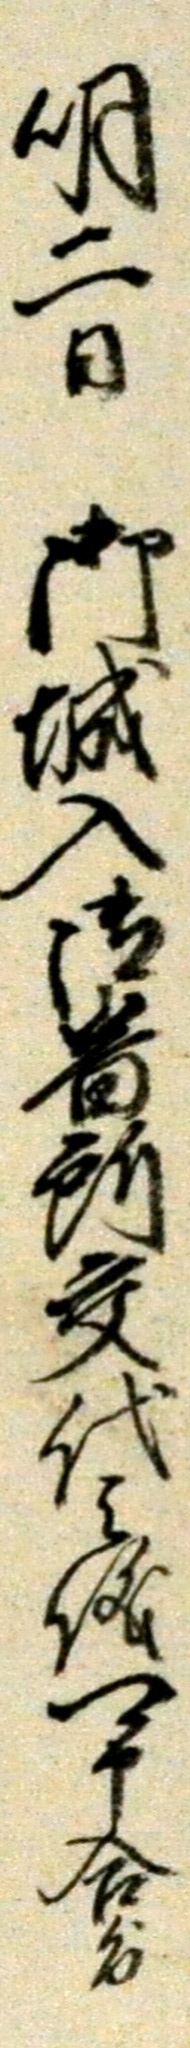明二日御城入御番所交代之儀可申合旨
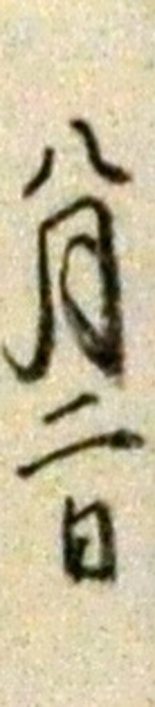八月二日
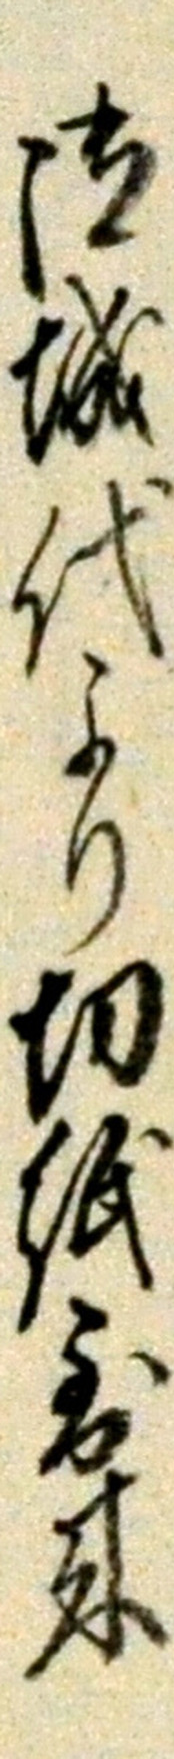御城代より切紙到来
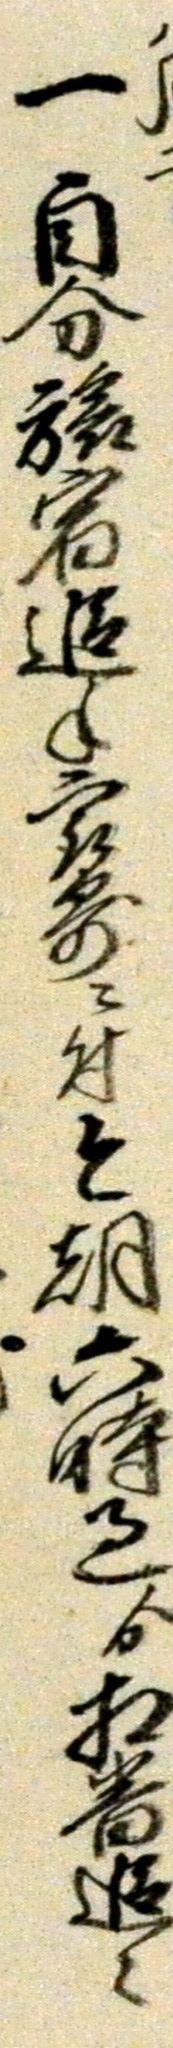一自分旅宿追手最寄ニ付今朝六時過ゟ相番追々
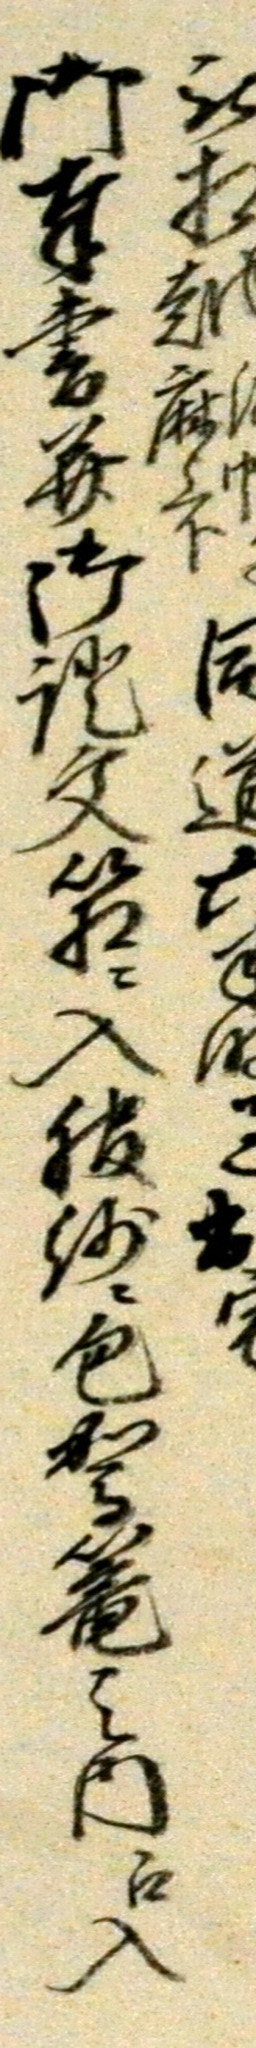御奉書并御證文箱ニ入服紗ニ包駕籠之内え入
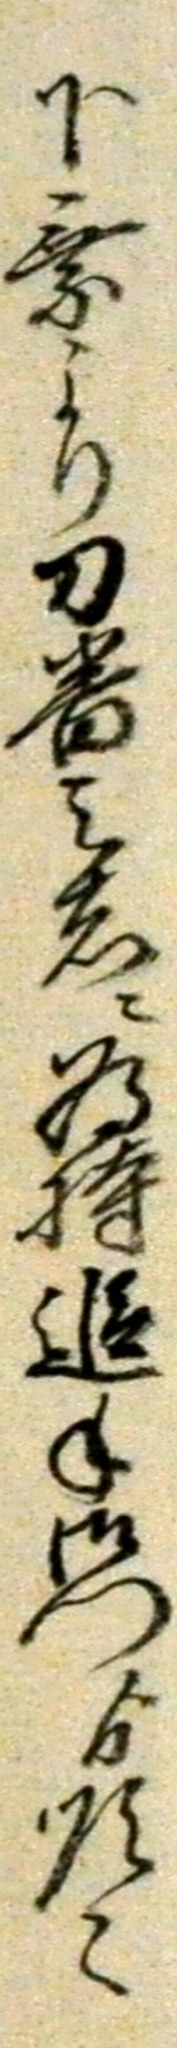下乗より刀之者ニ為持追手御門ゟ順々
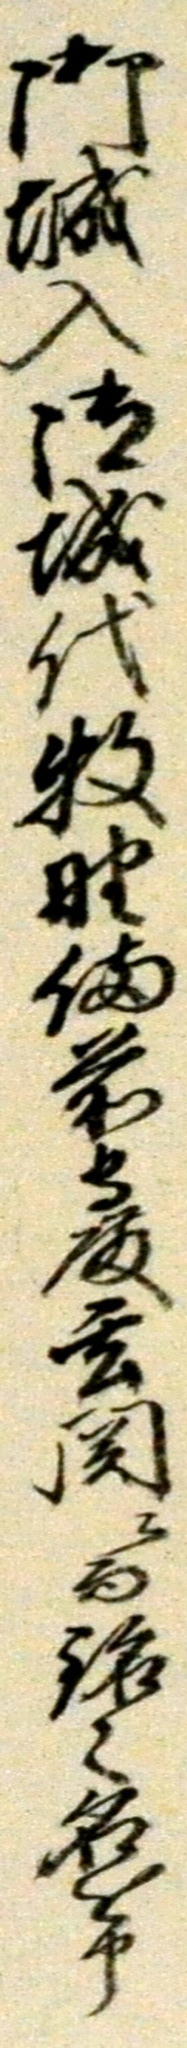御門入御城代牧野備前守殿玄関ニ而銘々名を申
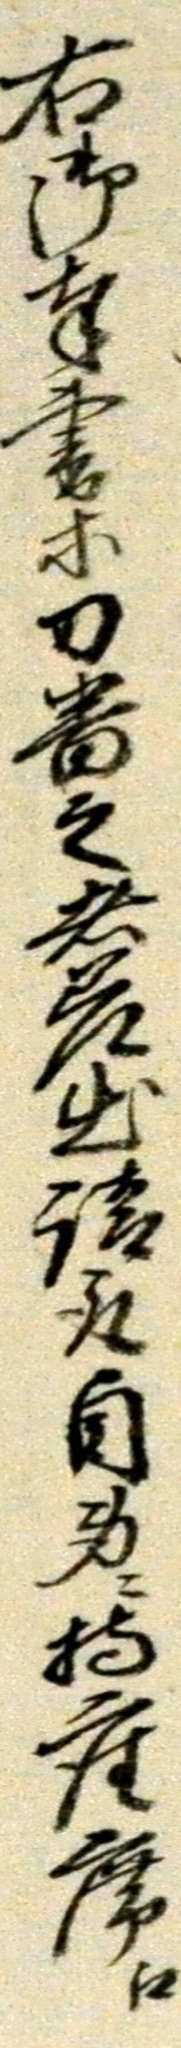右御奉書等刀番之者差出請取自身ニ持座席え
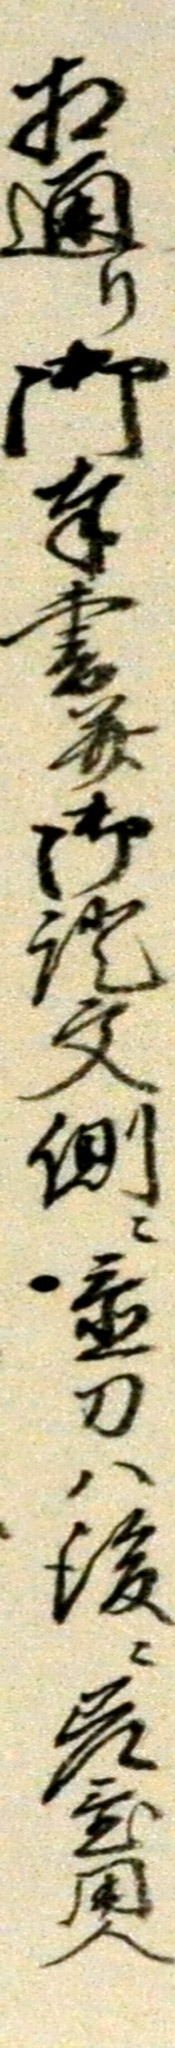相通り御奉書并御證文側ニ置刀ハ後ニ差置用人
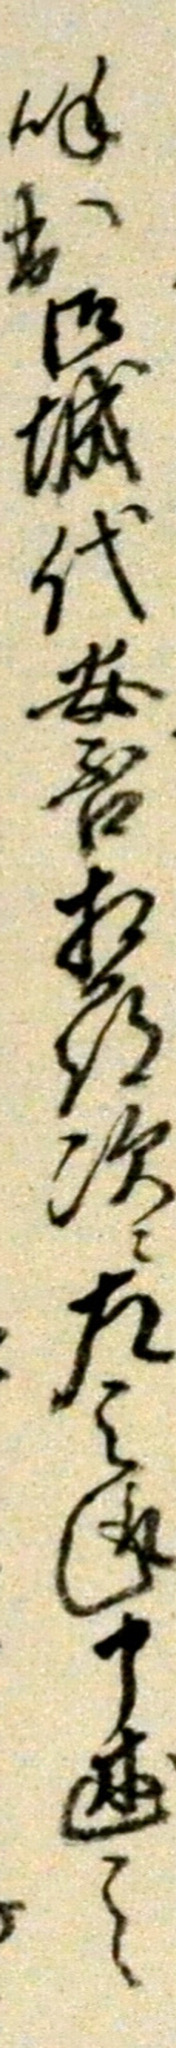呼出御城代安否相尋次ニ左之趣申述候
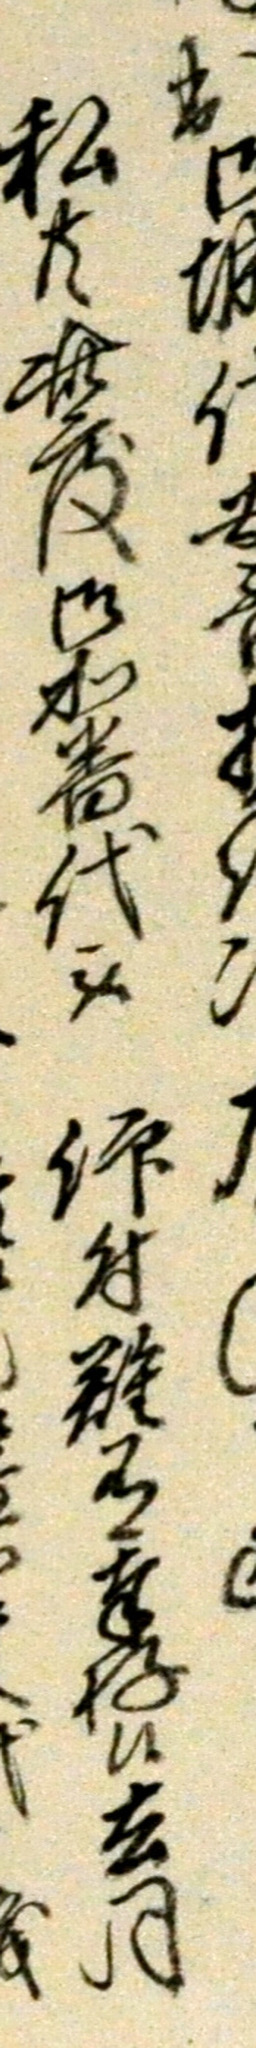私共此度御加番代被仰付難有奉存候去月
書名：大阪加番関係諸書留〔一括〕
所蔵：伊那市立高遠町図書館・合同会社AMANE
